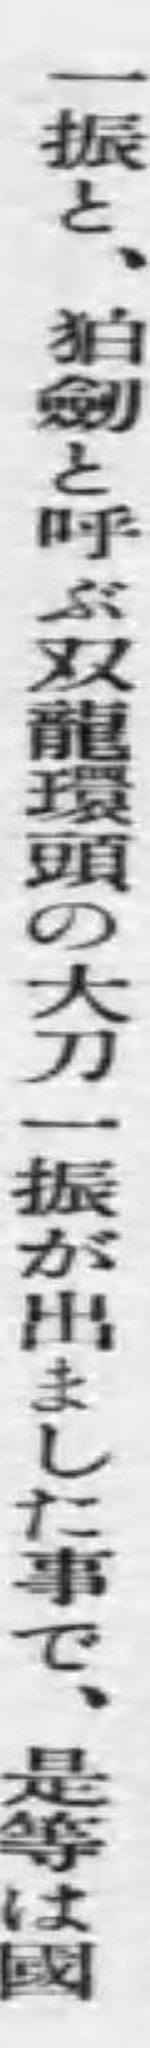一振と、狛剣と呼ぶ双龍環頭の大刀一振が出ました事で、是等は国
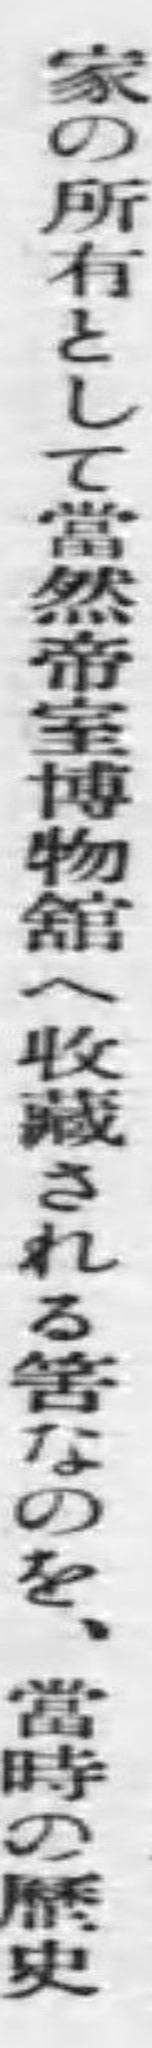家の所有として当然帝室博物館へ収蔵される筈なのを、当時の歴史
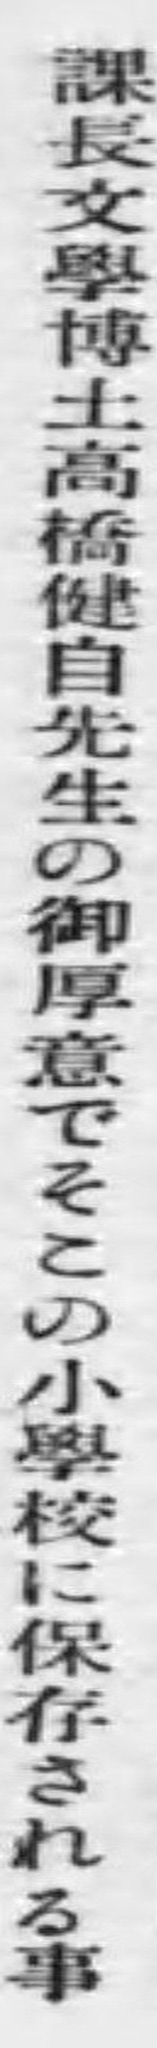課長文学博士高橋健自先生の御厚意でそこの小学校に保存される事
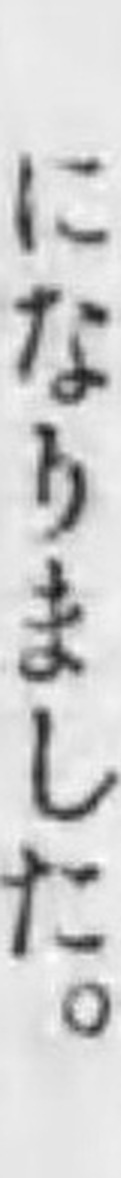になりました。
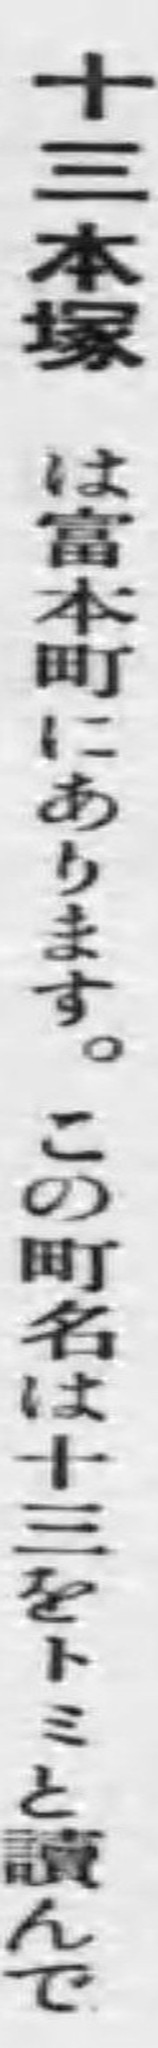十三本塚は富本町にあります。この町名は十三をトミと読んで
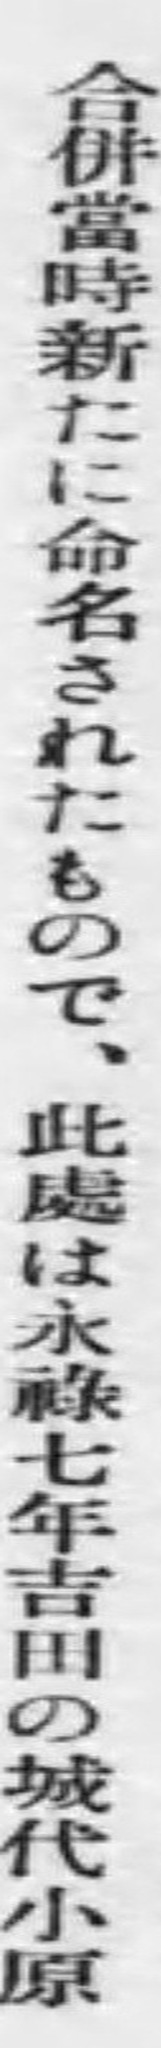合併当時新たに命名されたもので、此処は永禄七年吉田の城代小原
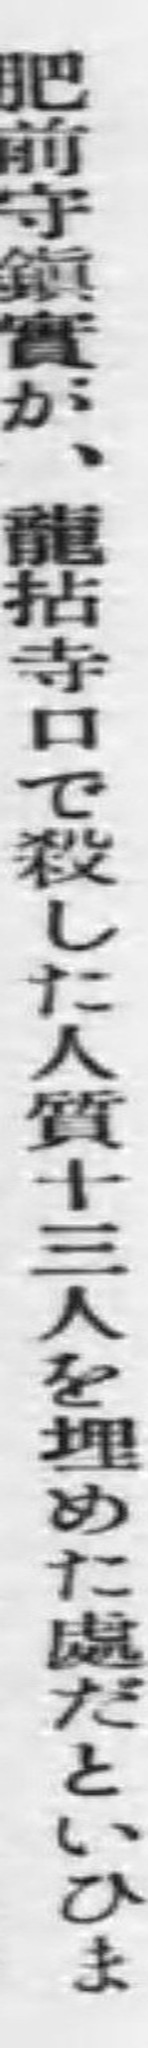肥前守鎮実が、龍拈寺口で殺した人質十三人を埋めた処だといひま
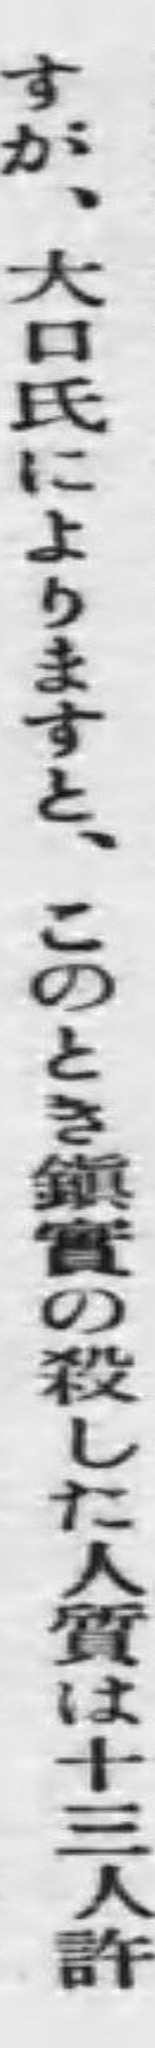すが、大口氏によりますと、このとき鎮実の殺した人質は十三人許
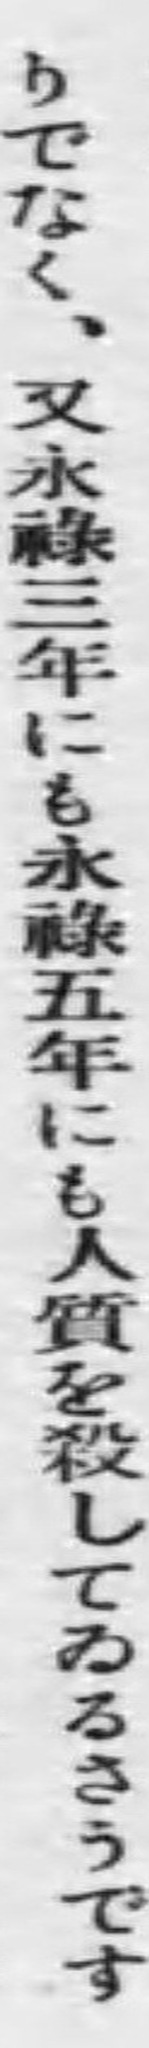りでなく、又永禄三年にも永禄五年にも人質を殺してゐるさうです
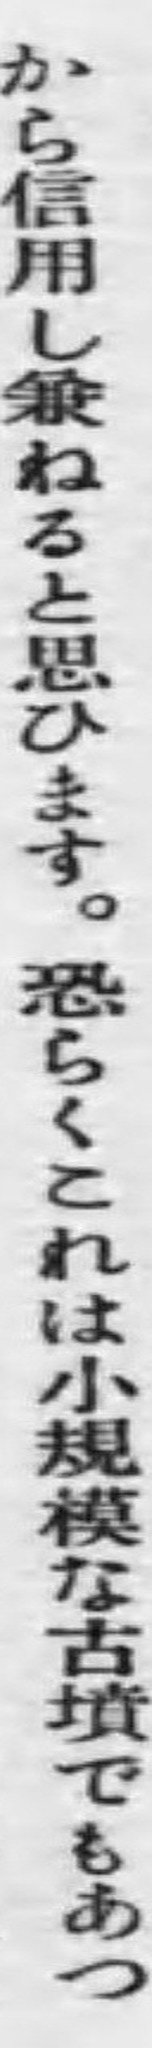から信用し兼ねると思ひます。恐らくこれは小規模な古墳でもあつ
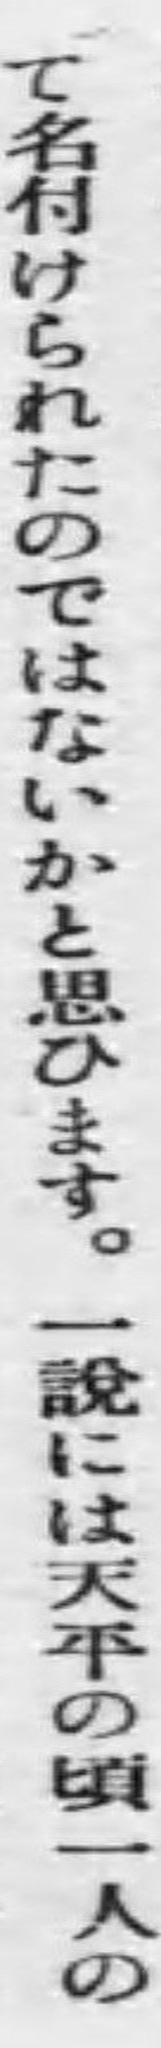て名付けられたのではないかと思ひます。一説には天平の頃一人の
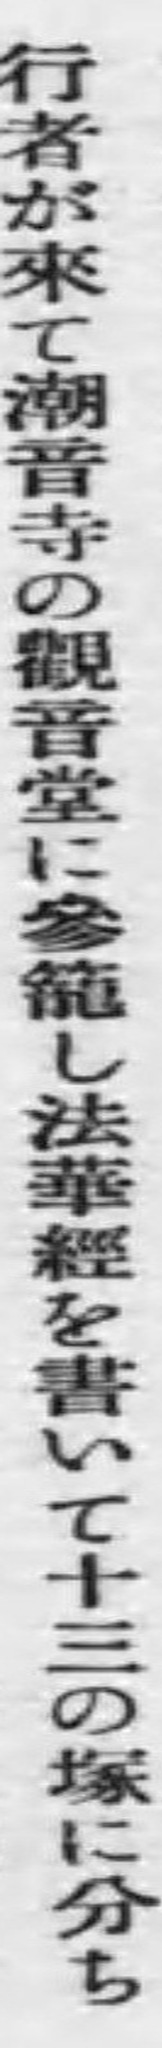行者が来て潮音寺の観音堂に参籠し法華経を書いて十三の塚に分ち
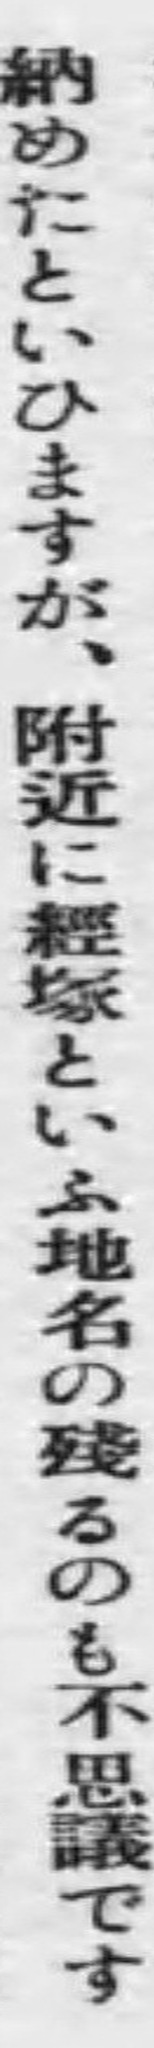納めたといひますが、附近に経塚といふ地名の残るのも不思議です
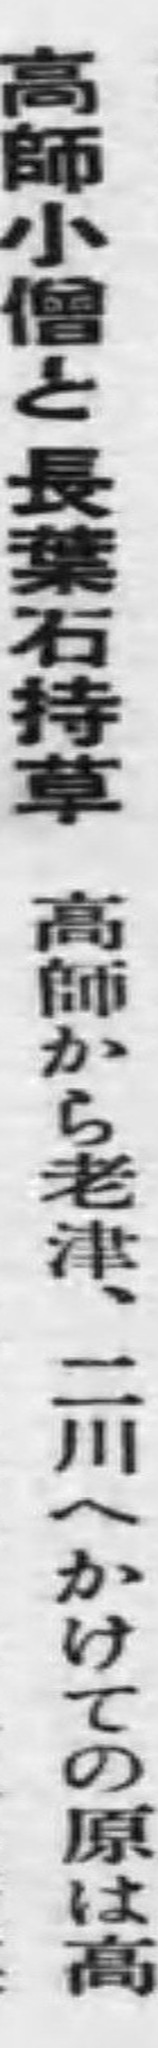高師小僧と長葉石持草高師から老津、二川へかけての原は高
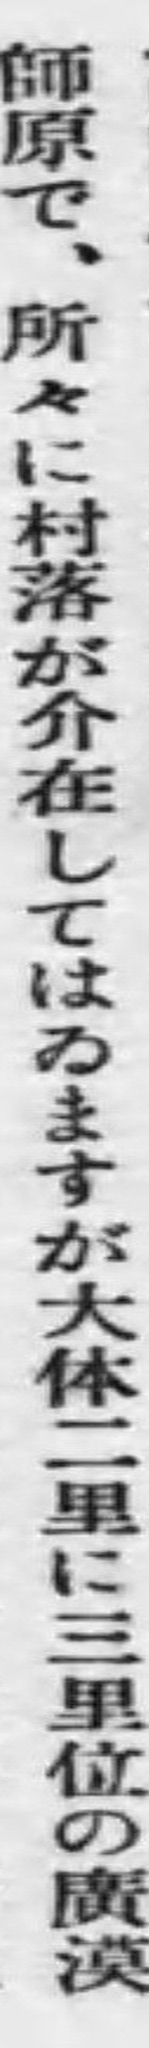師原で、所々に村落が介在してはゐますが大体二里に三里位の広漠
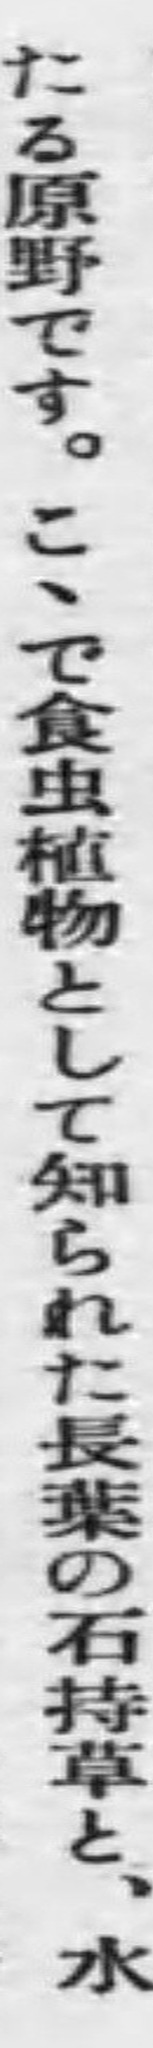たる原野です。こゝで食虫植物として知られた長葉の石持草と、水
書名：東三河道中記 : 豊橋市及其附近案内
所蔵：国立国会図書館 National Diet Library, JAPAN
